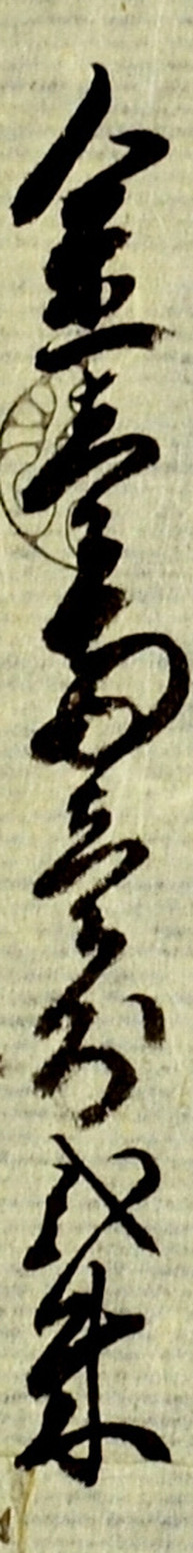金壱両壱分弐朱
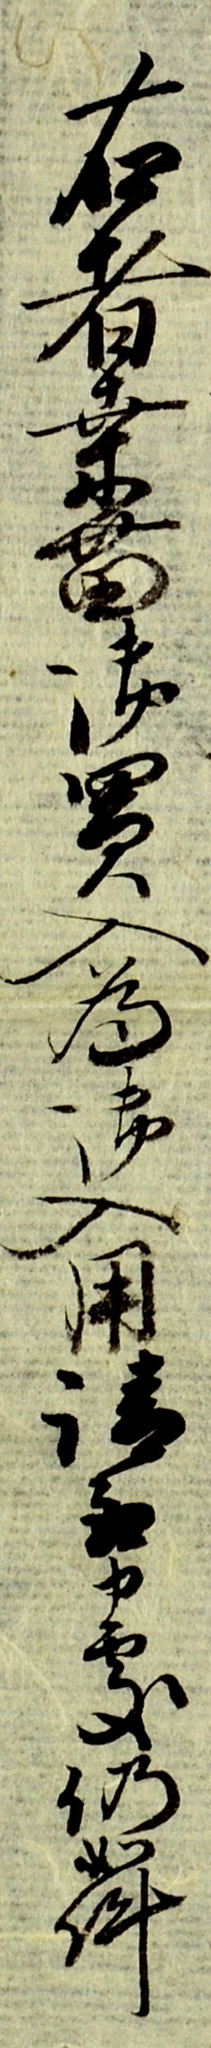右者桑苗御買入為御入用請取申処仍如件
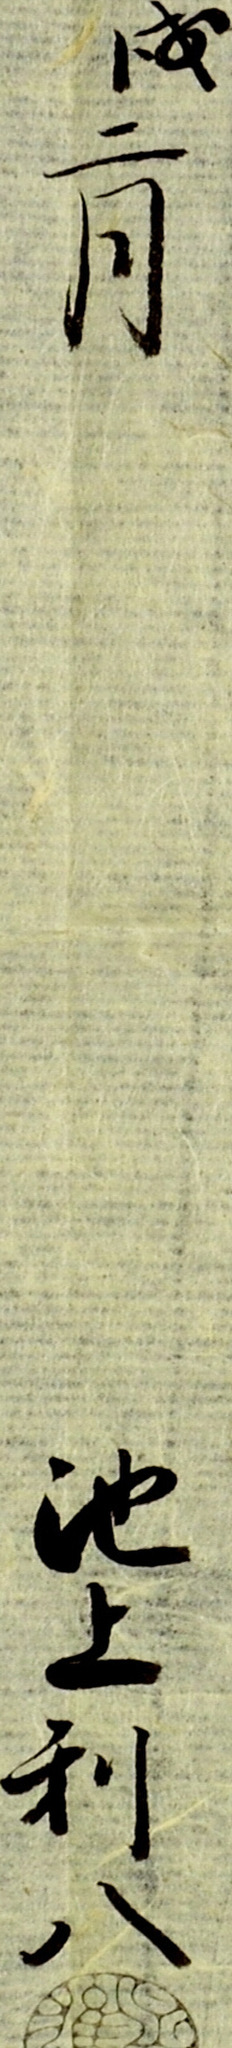戌二月池上利八㊞
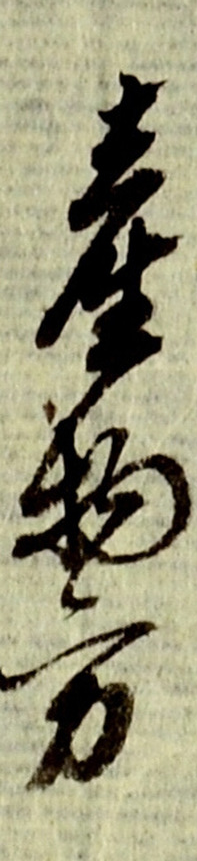産物方
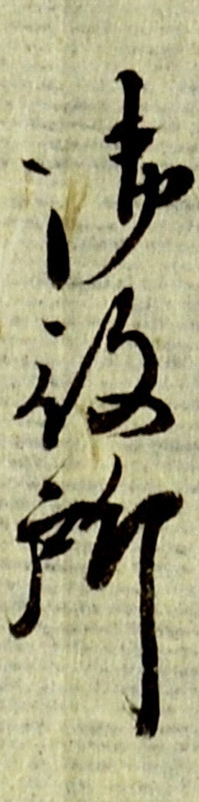御役所

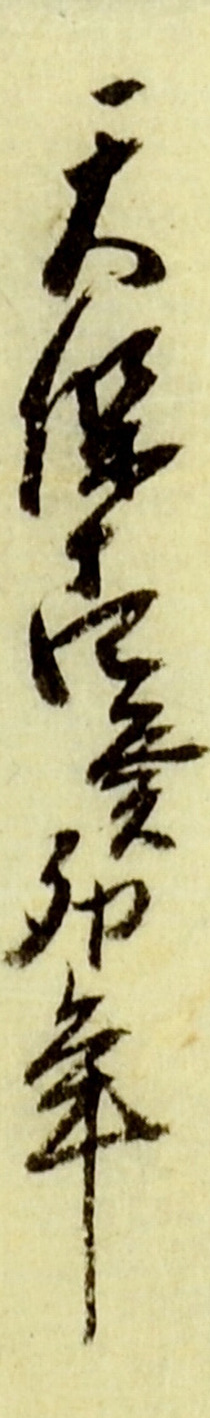天保十四癸卯年
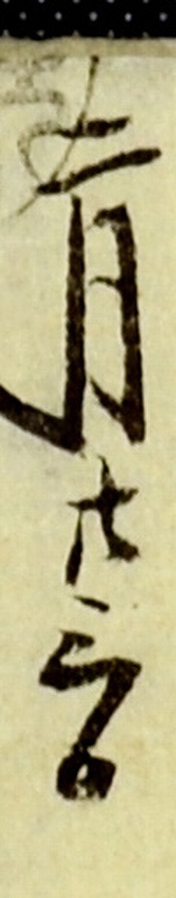二月廿三日
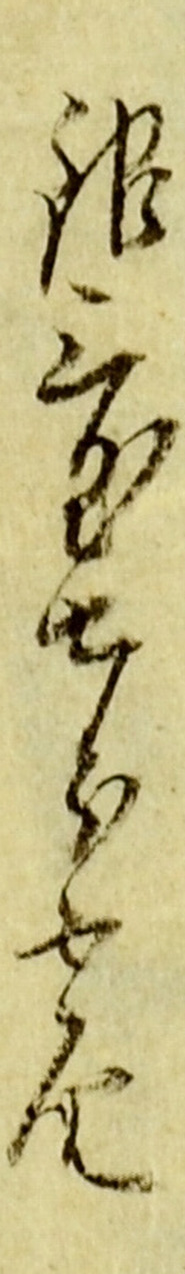銀三匁七分五厘
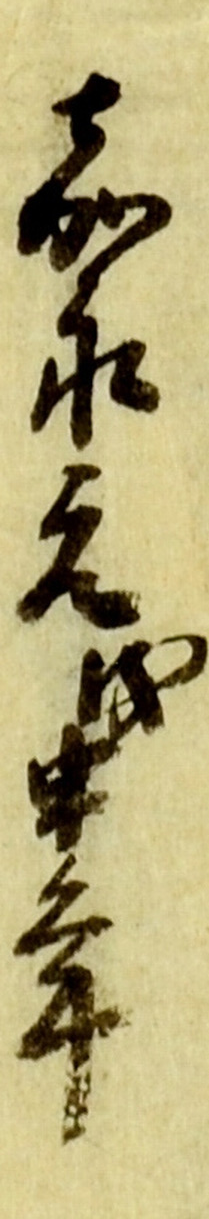嘉永元戊申年
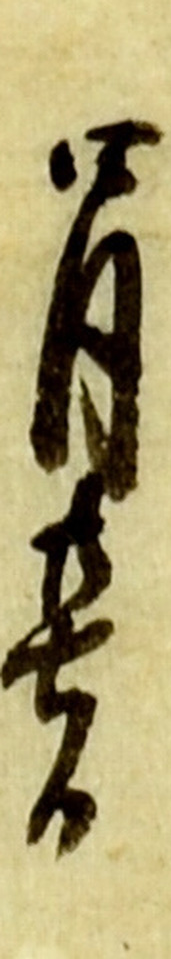四月廿七日
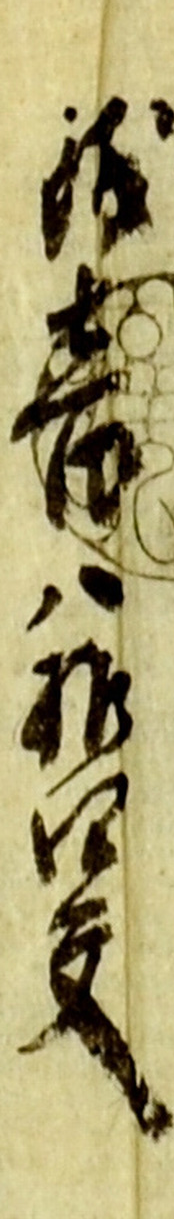銭七百八拾四文
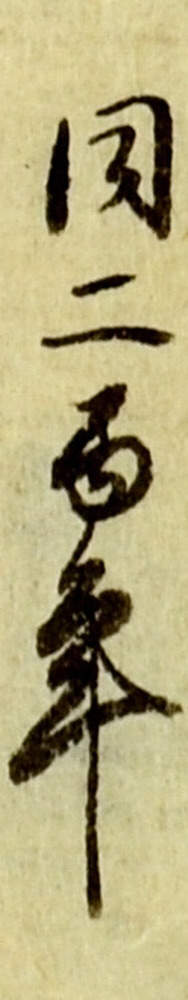同二酉年
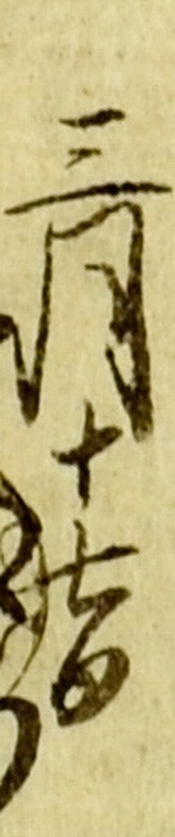三月十七日
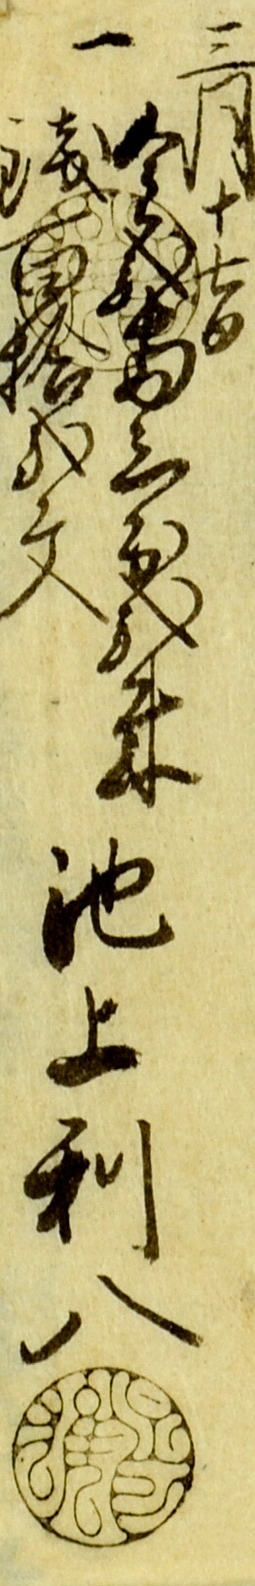一金弐両三分弐朱池上利八㊞
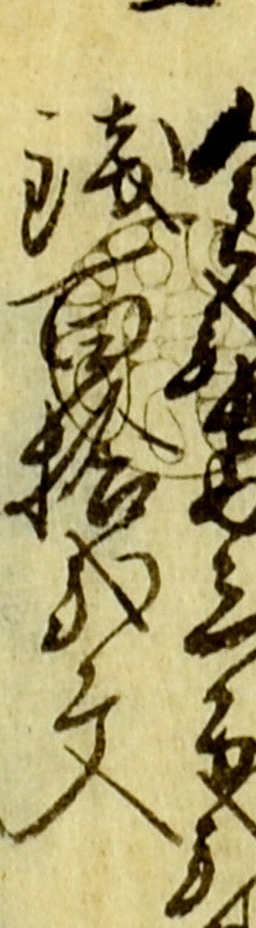銭百拾弐文
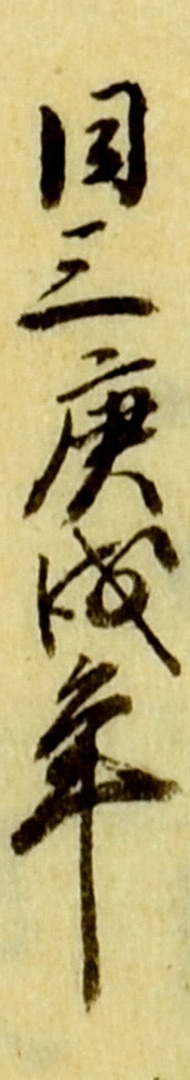同三庚戌年
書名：桑畑御入用金請取通
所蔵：伊那市立高遠町図書館・合同会社AMANE
